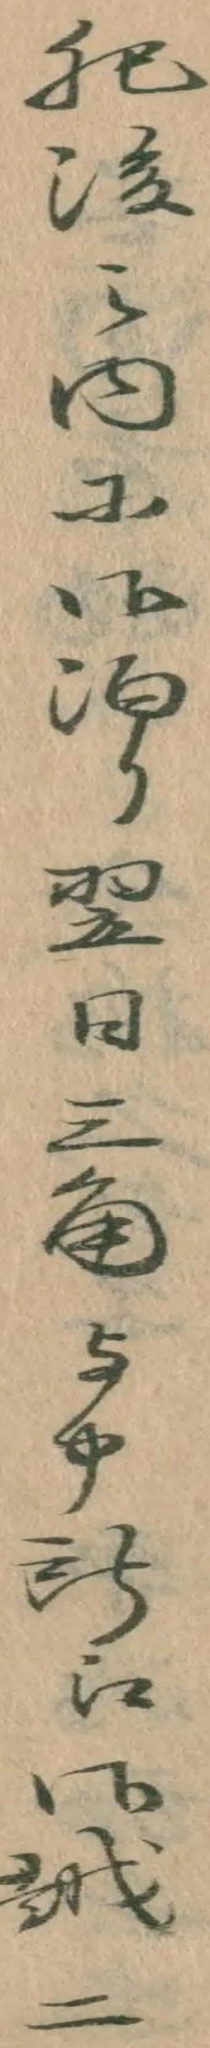肥後之内に御泊り翌日三角と申所江御越二
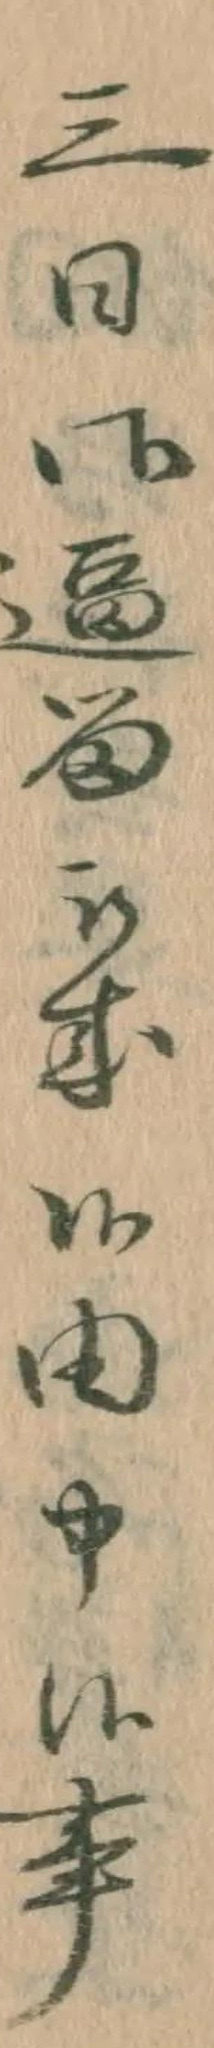三日御逗留被成候由申候事
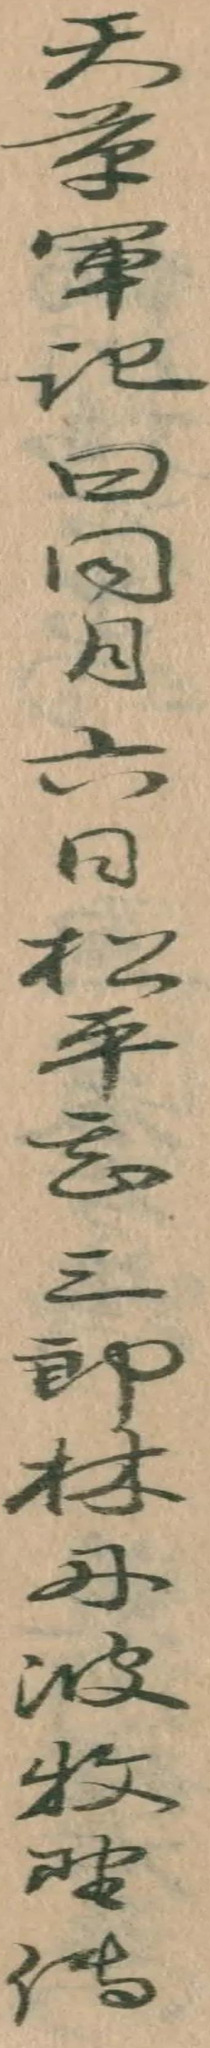天草軍記曰同月六日松平甚三郎林丹波牧野伝
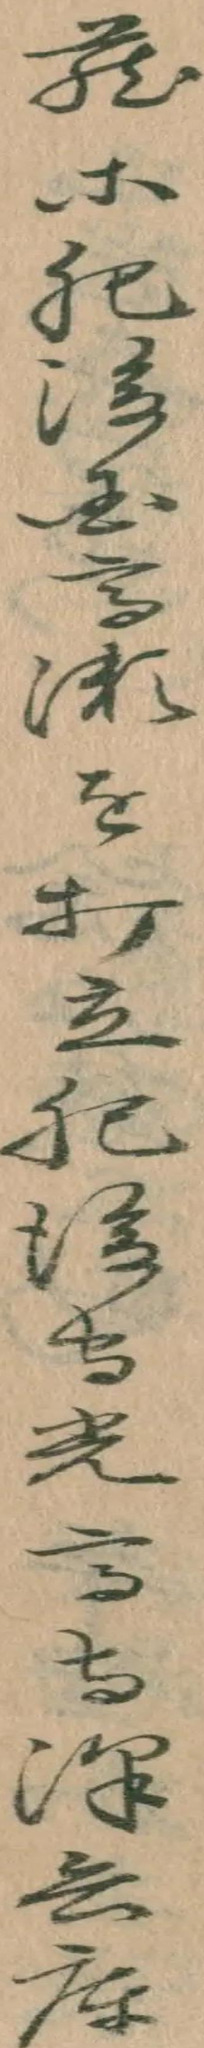蔵等肥後国高瀬を打立肥後守光高寺沢兵庫
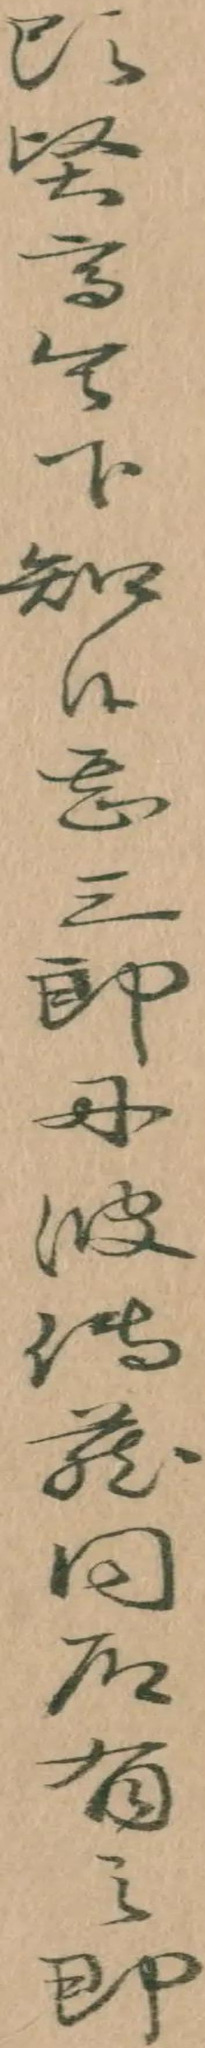頭堅高令下知候甚三郎丹波伝蔵同道有之即
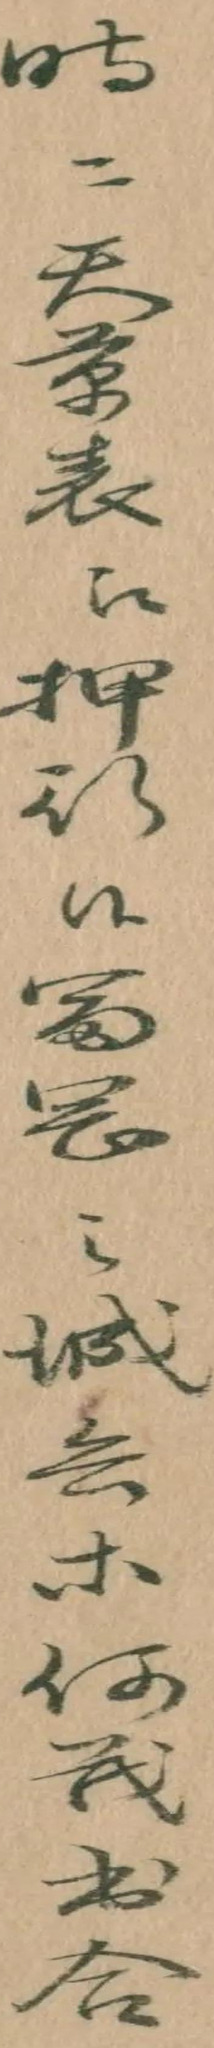時に天草表江押行候富岡之城兵等何も出合
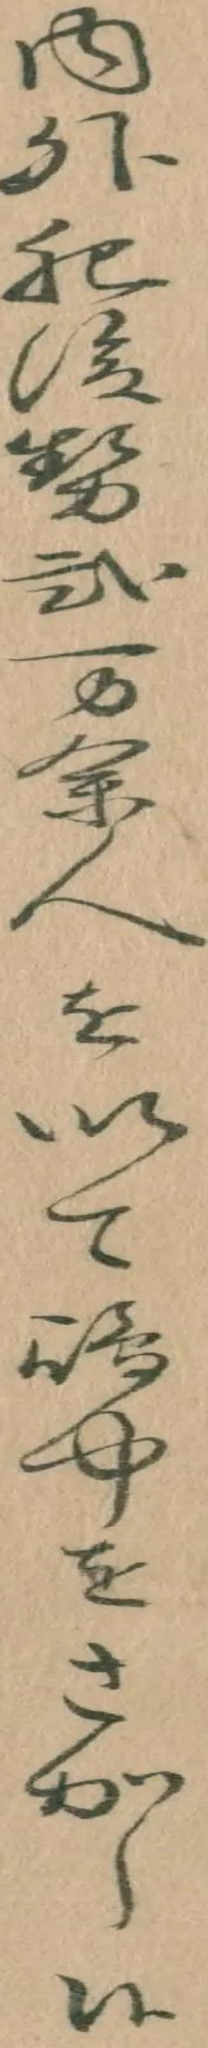内外肥後勢弐万余人を以て島中をさかし候
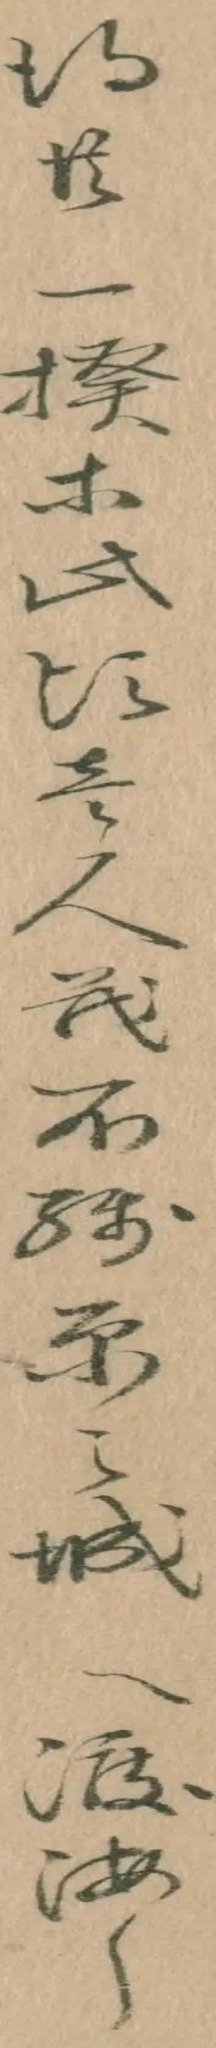得共一揆等此頃壱人も不残原之城へ渡海し
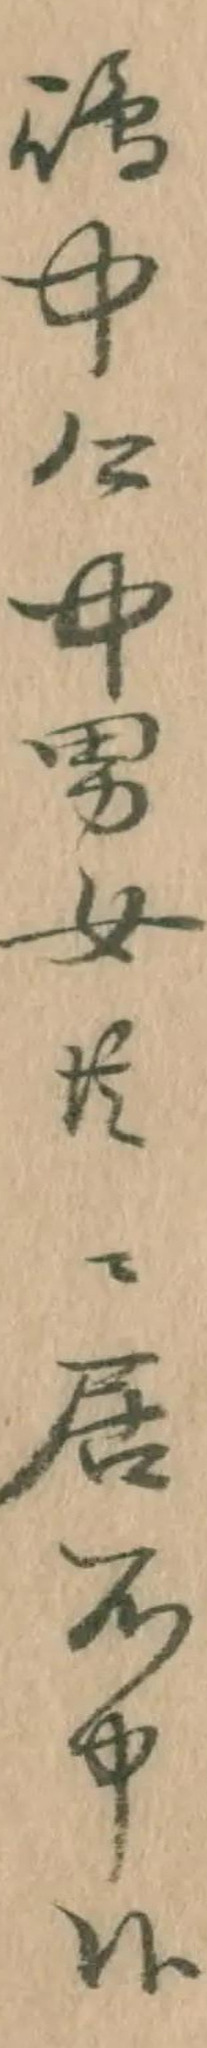島中郷中男女共に居不申候
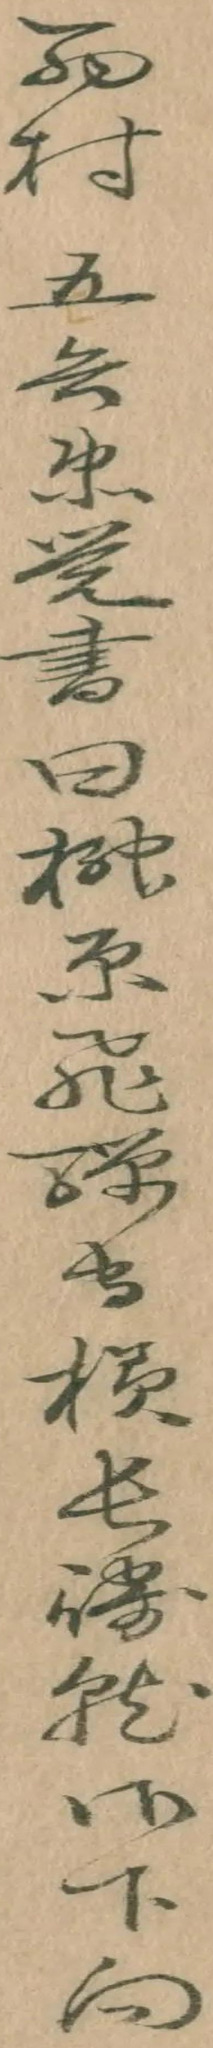西村五兵衛覚書曰榊原飛騨守様長崎就御下向
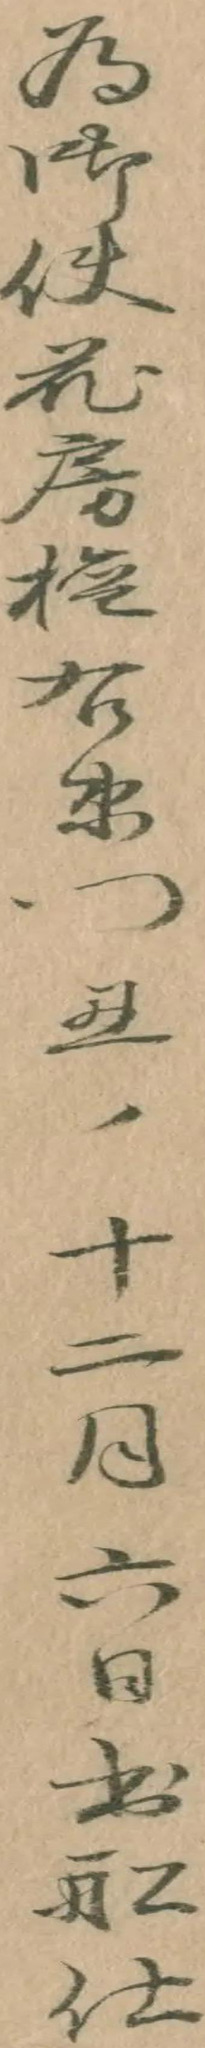為御使花房権左衛門丑ノ十二月六日出船仕
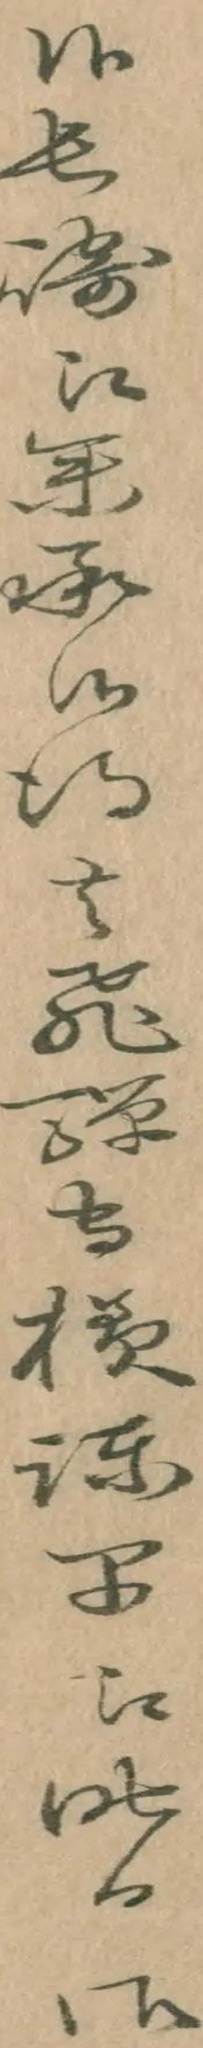候長崎江参承候得は飛騨守様諫早江昨日御
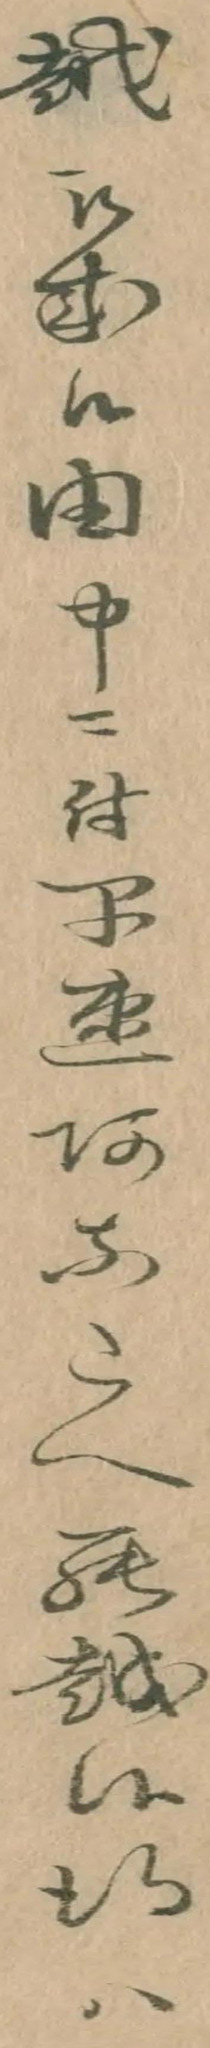越被成候由申に付早速あなたへ罷越候得は
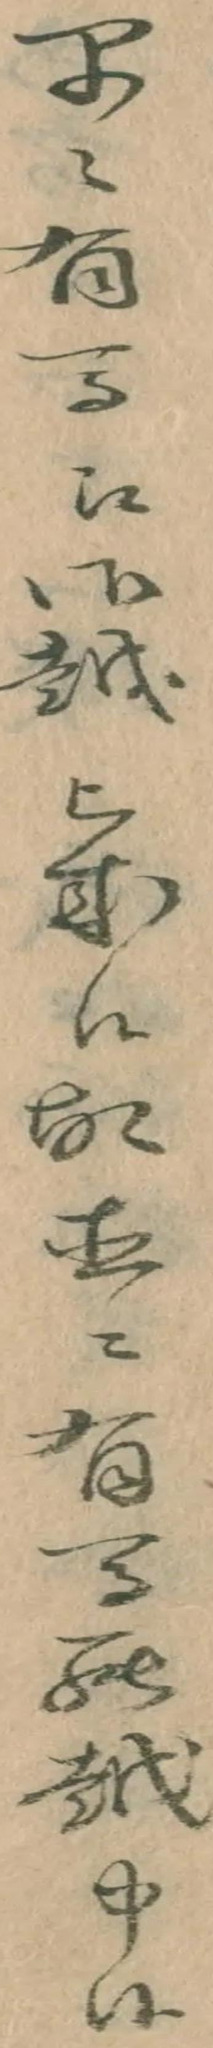早々有馬江御越被成候故直に有馬罷越申候

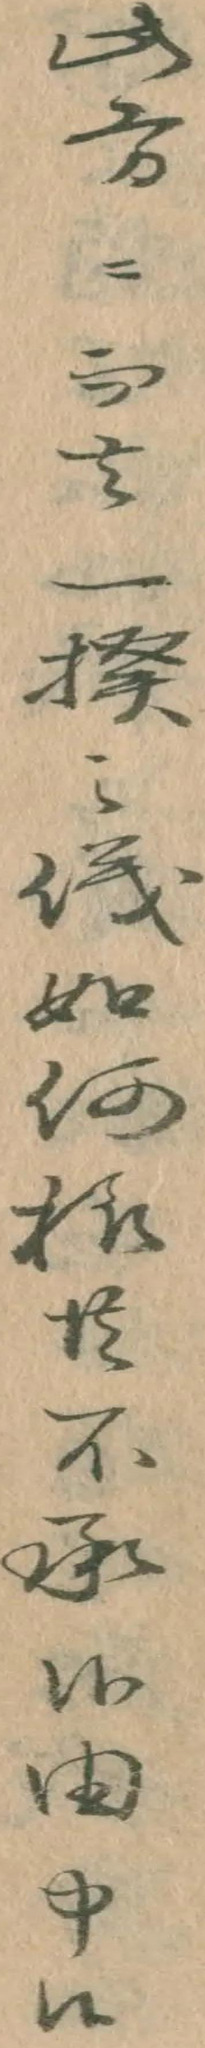此方に而は一揆之儀如何様共不承候由申候
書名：切支丹御退治記 49巻. [3]
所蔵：国立国会図書館 National Diet Library, JAPAN
